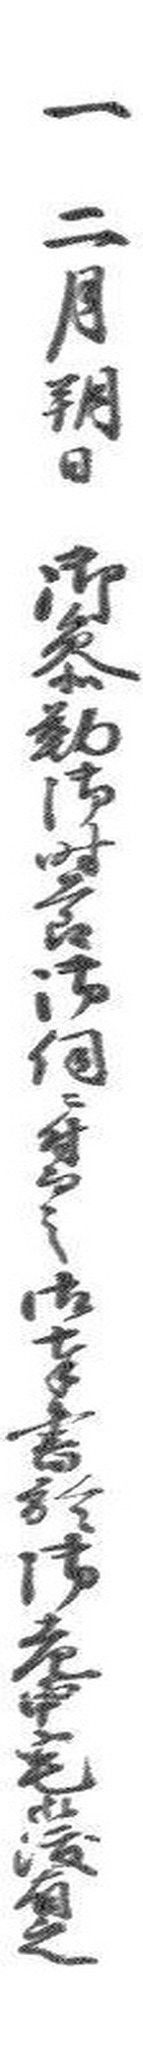一二月朔日御参勤御時節御伺ニ付而之御奉書於御老中宅御渡有之
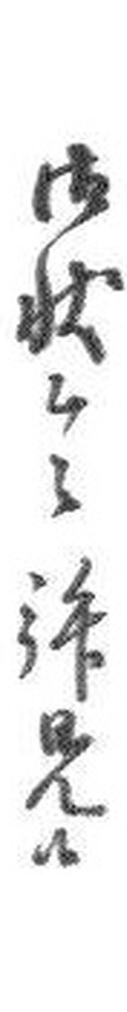御状令拝見候
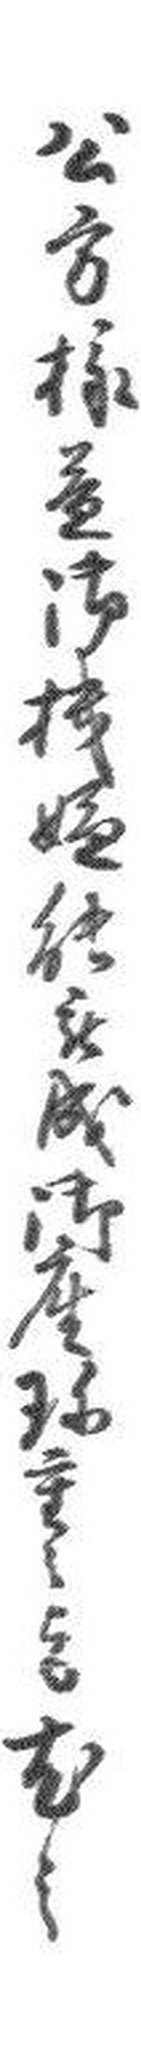公方様益御機嫌能被成御座珍重之旨尤之
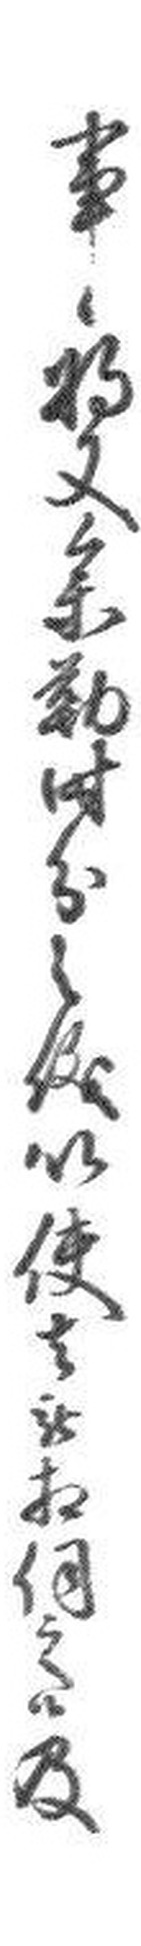事候将又参勤時分之儀以使者相伺之候及
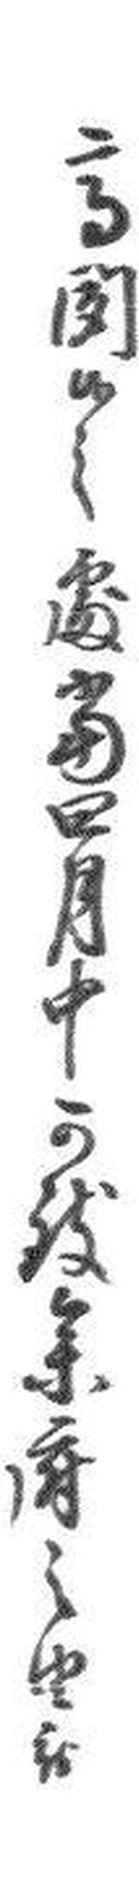高聞候之処当四月中可致参府之由被
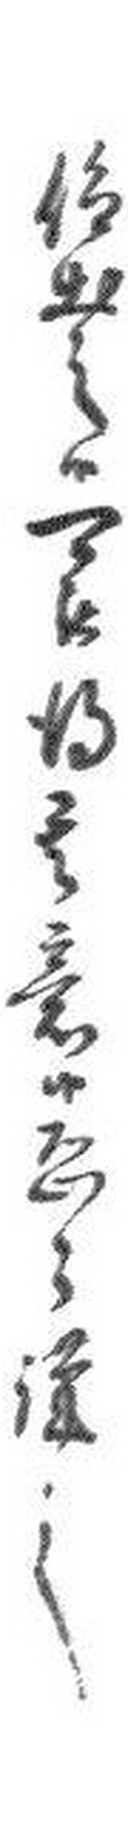仰出之候可被得其意候恐々謹言
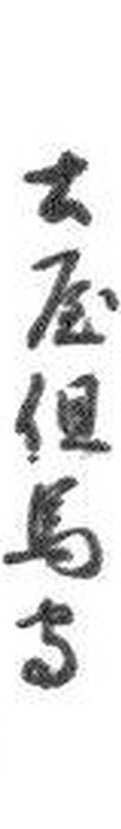土屋但馬守

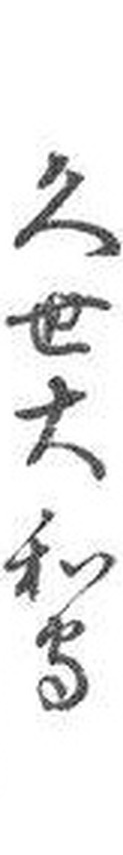久世大和守
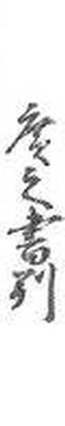広之書判
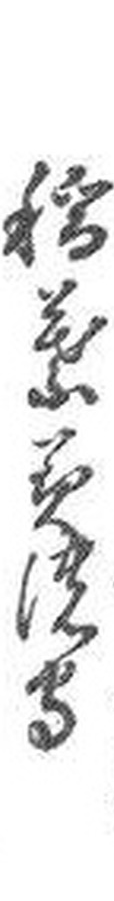稲葉美濃守
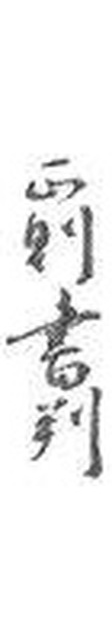正則書判
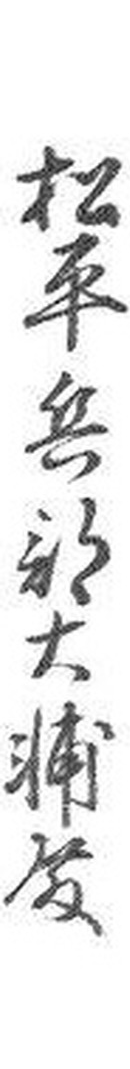松平兵部大輔殿
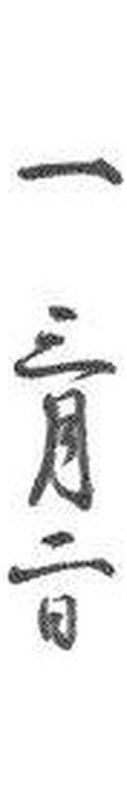一三月二日
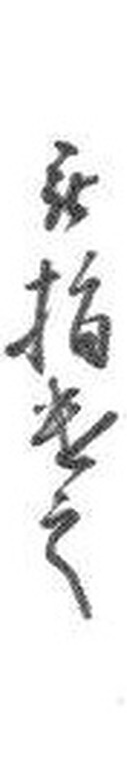被指遣之
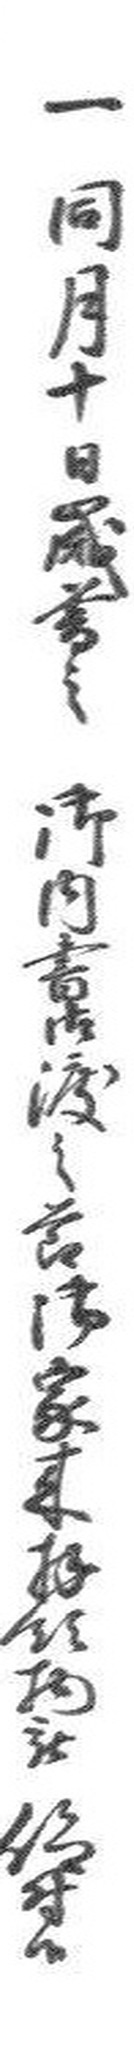一同月十日歳暮之御内書御渡之節御家来拝領被仰付候
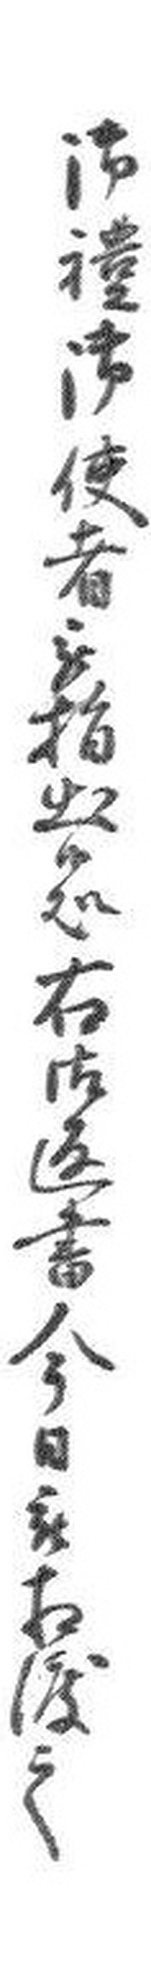御礼御使者被指出候処右御返書今日被相渡之
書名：家譜 十一 昌親公 従延宝二年到延宝四年八月
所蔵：福井県文書館 Fukui Prefectural Archives
